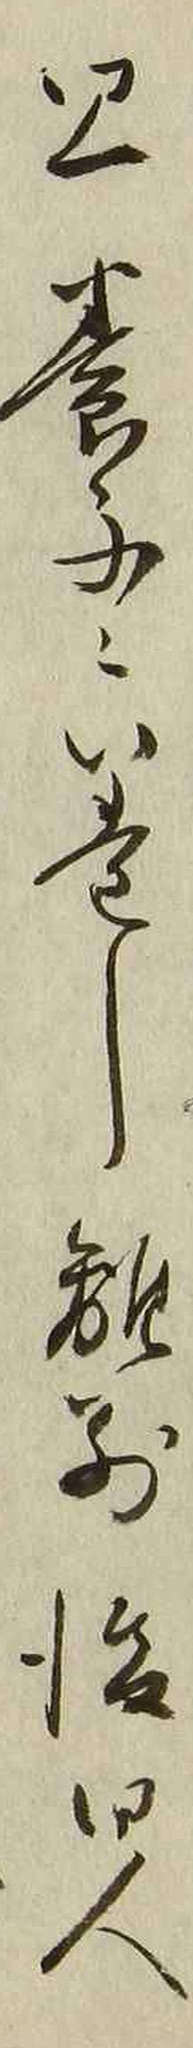旦養子といたし離別後同人
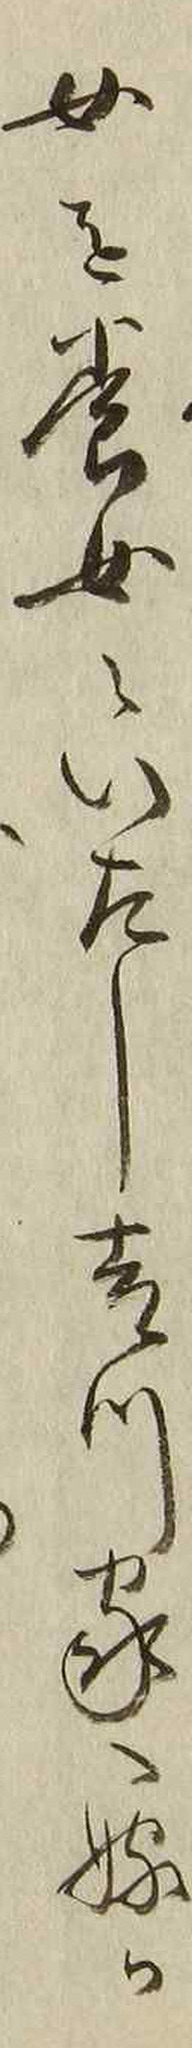女を養女にいたし吉川家へ嫁候
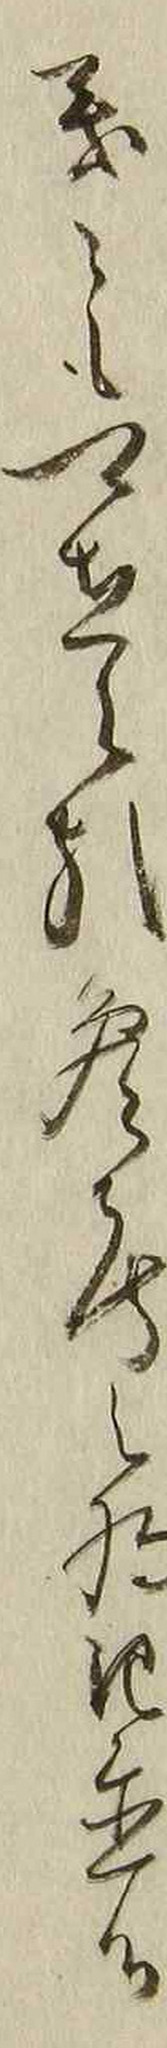義にも可在哉参考之為記置候
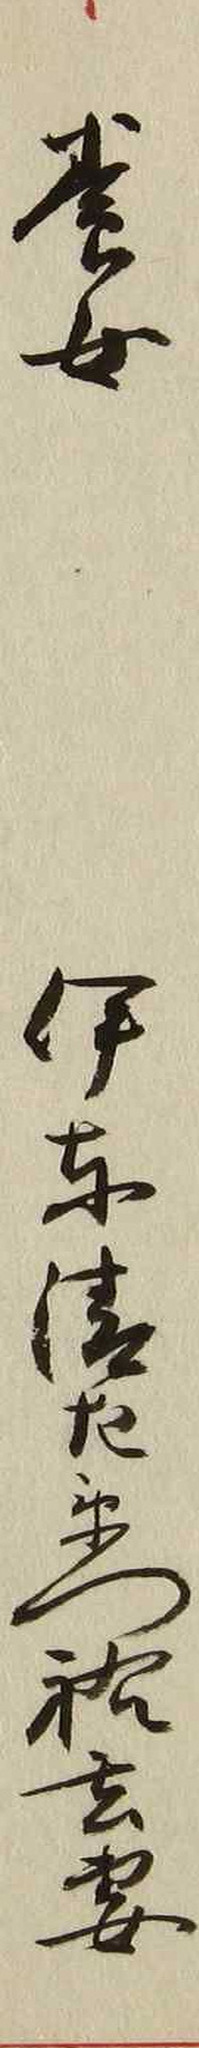養女伊東清左衛門礼玄妻
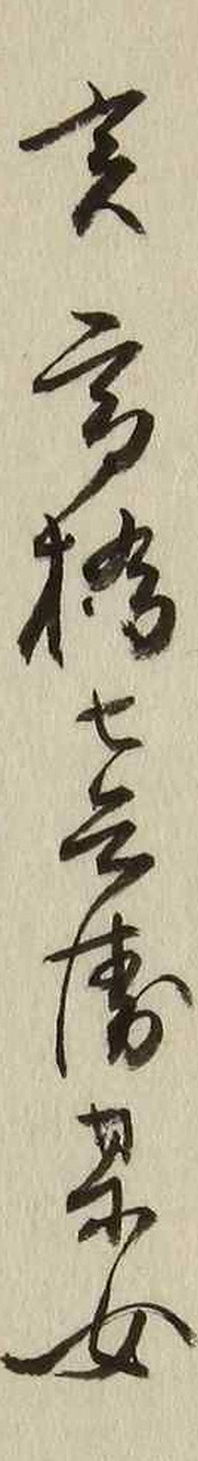実高橋七兵衛某女
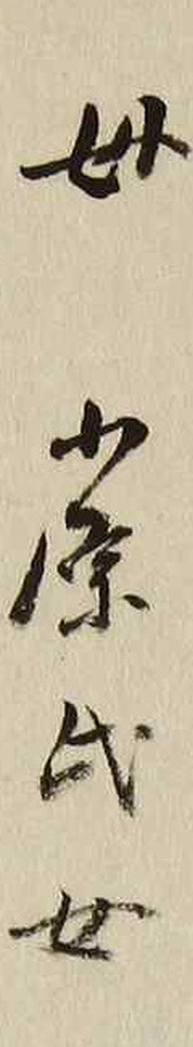母小原氏女
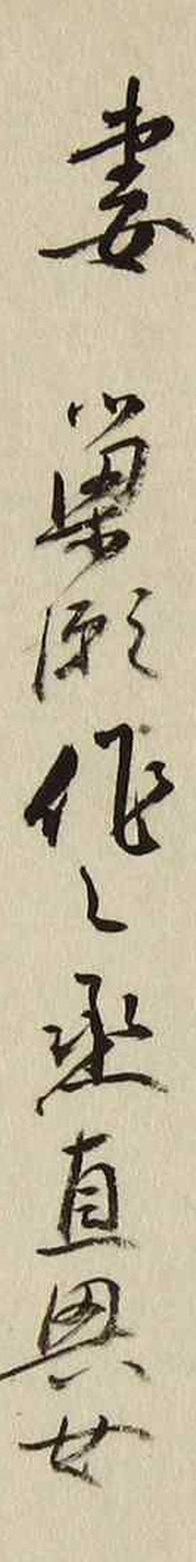妻巣瀬作之丞直興女
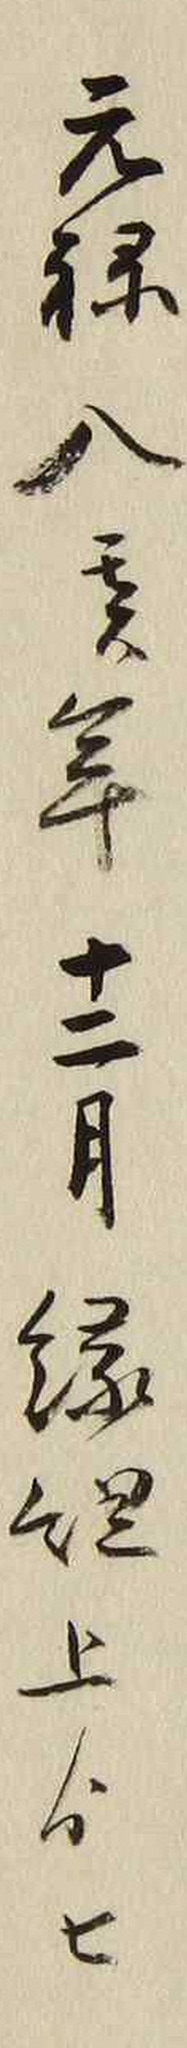元禄八亥年十二月縁組上ゟ被
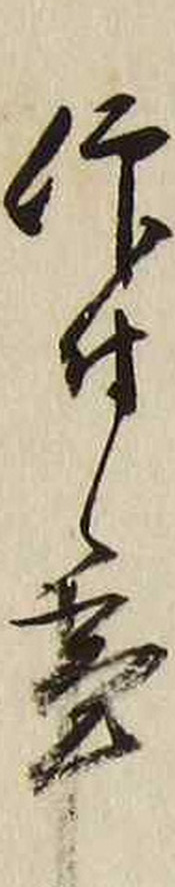仰付候事

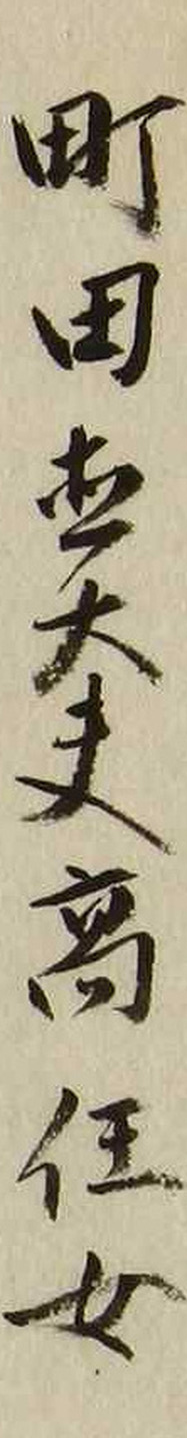町田直太夫高住女
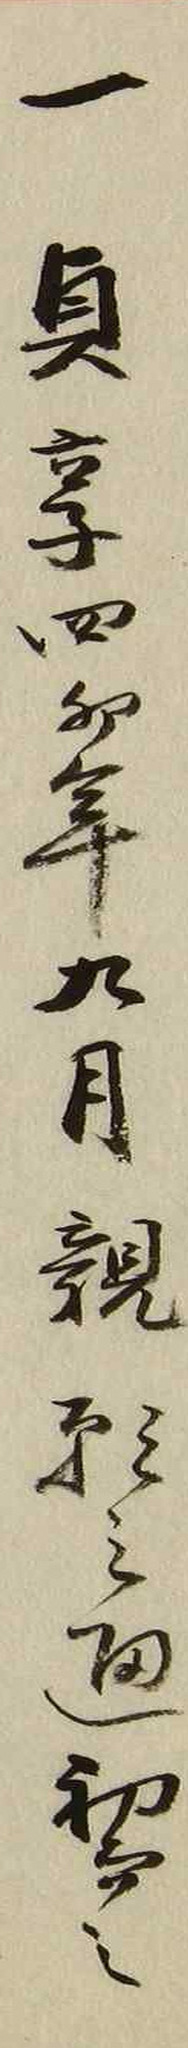一貞享四卯年九月親願之通初而之
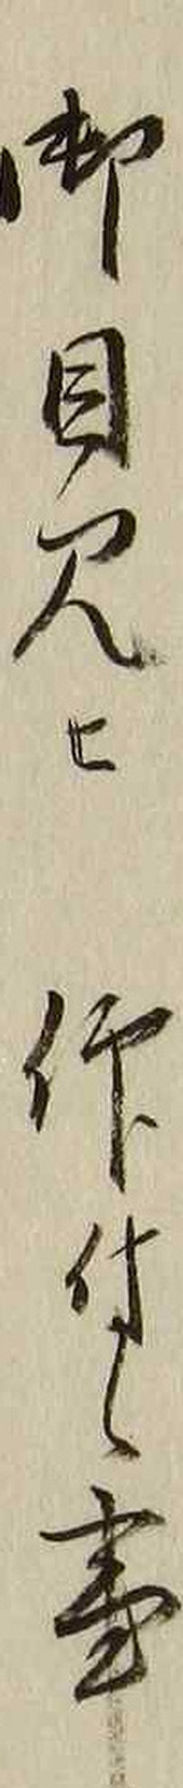御目見被仰付候事
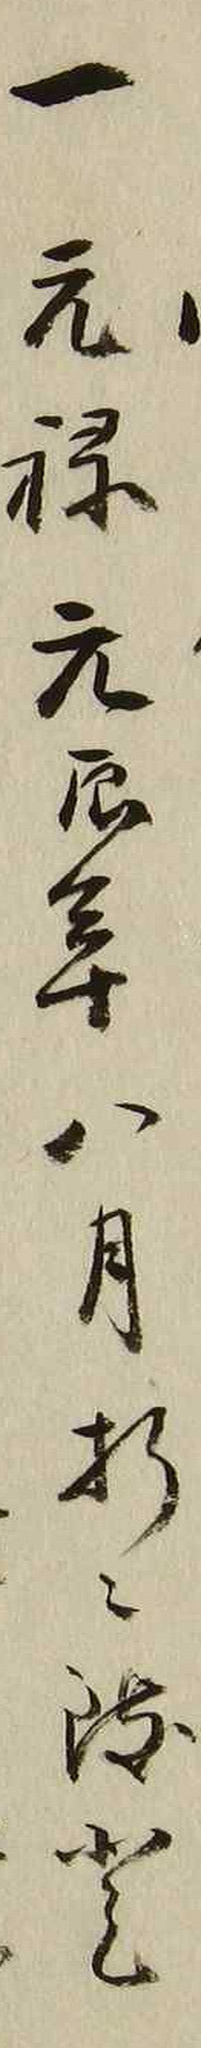一元禄元辰年八月折々致登
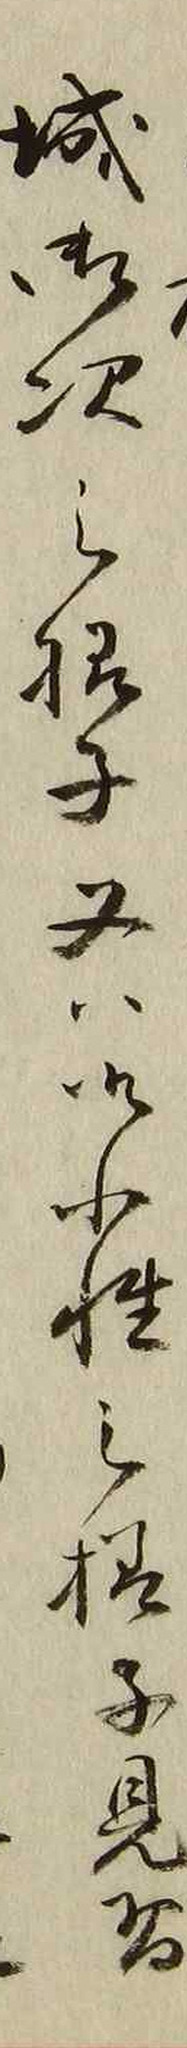城御次之様子又は御小姓之様子見習
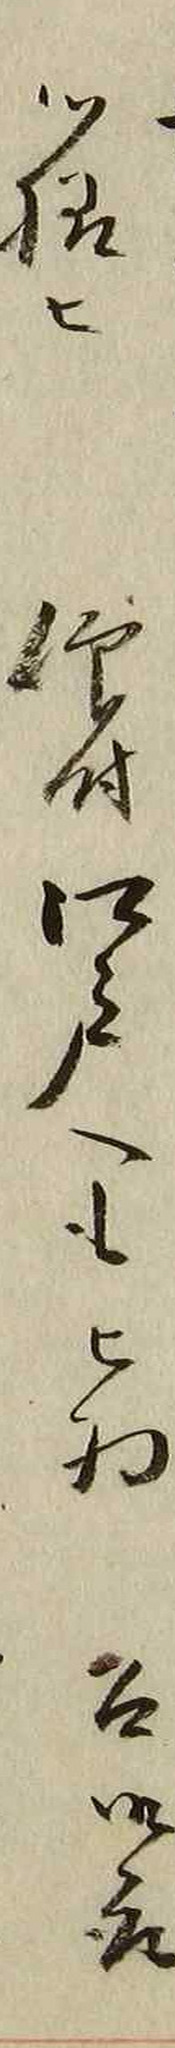候様被仰付江戸へも被為召御取
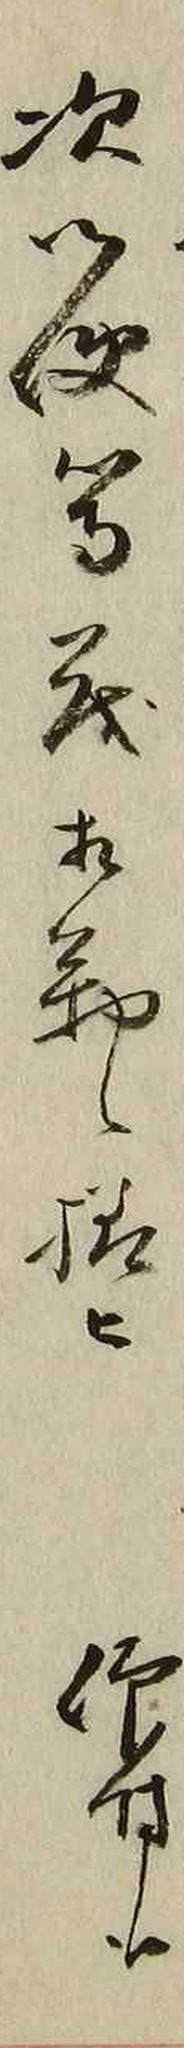次御使等も相勤候様被仰付候
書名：諸士系譜　巻之292　き之部1
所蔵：会津若松市立会津図書館
